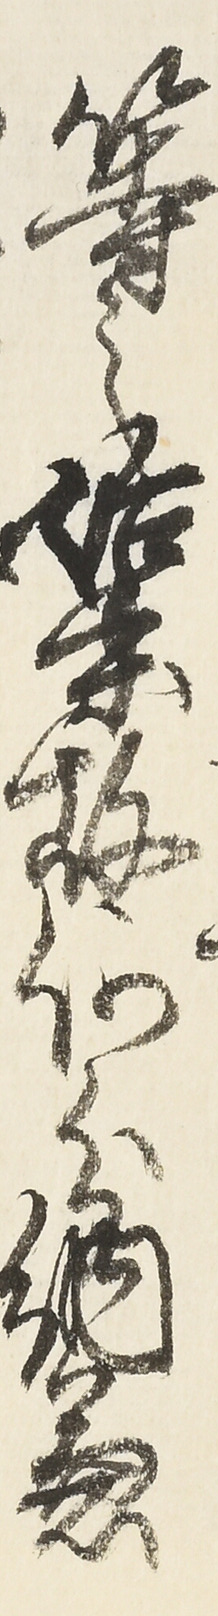等之始末故何分納兼
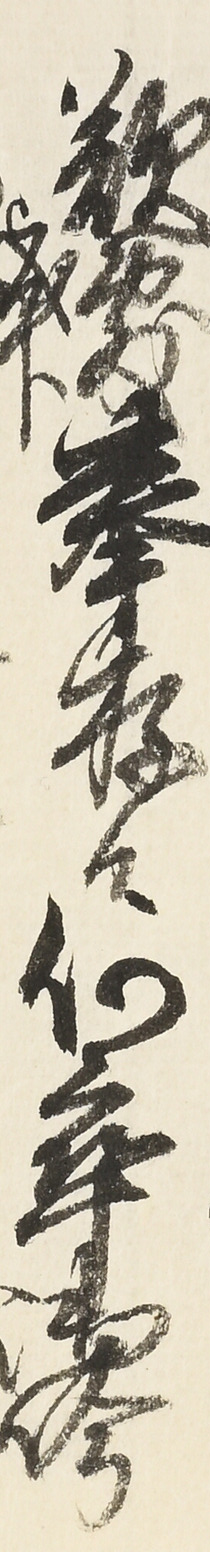歎敷奉存候何年御吟
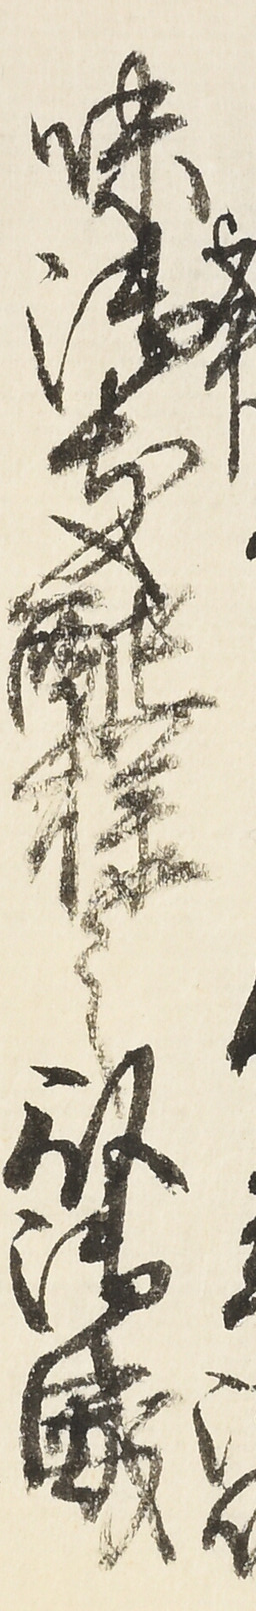味御支配様之役御威
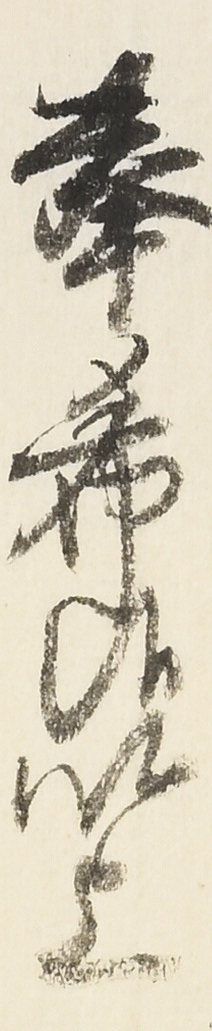奉希候以上
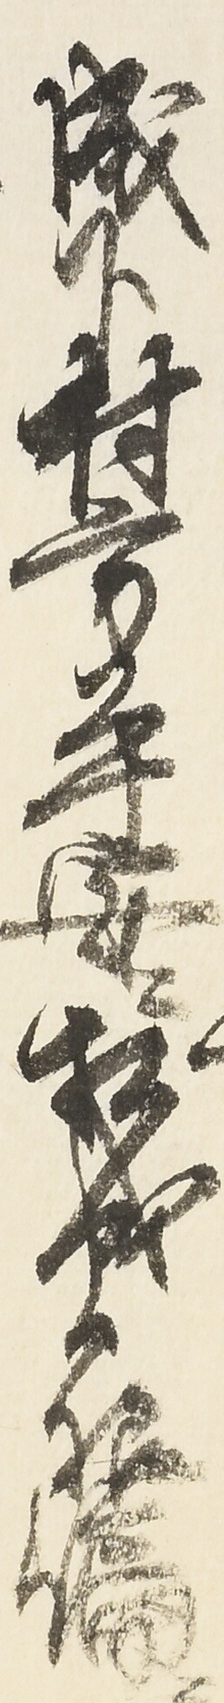成下村方平安ニ相成候様偏ニ
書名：乍恐御内々子委奉申上度口上書
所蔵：伊那市立高遠町図書館・合同会社AMANE
